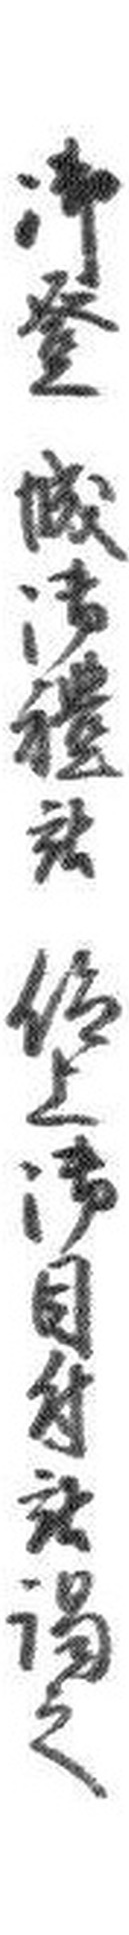御登城御礼被仰上御目付被謁之
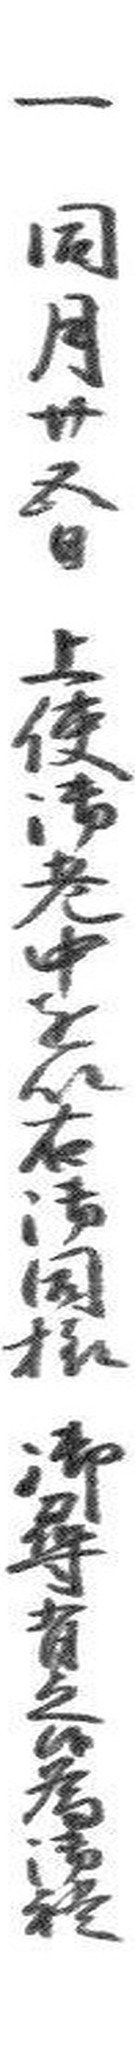一同月廿五日上使御老中を以右御同様御尋有之候為御礼
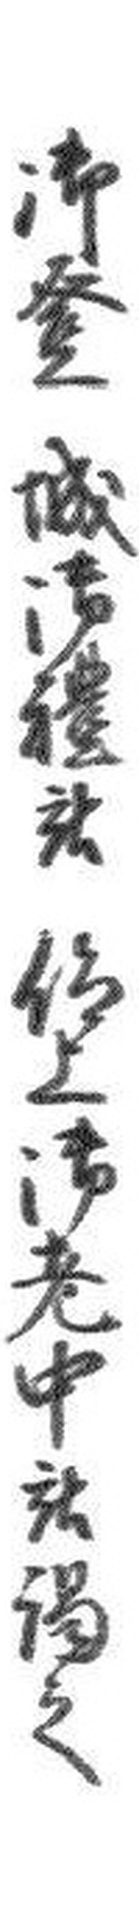御登城御礼被仰被仰上御老中被謁之

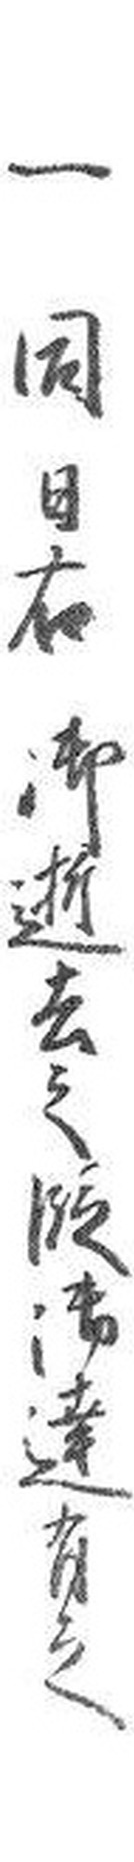一同日右御逝去之段御達有之
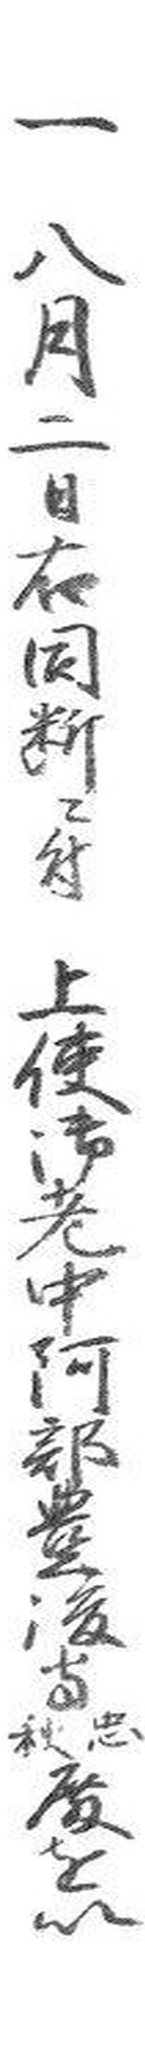一八月二日右同断ニ付上使御老中阿部豊後守忠秋を以
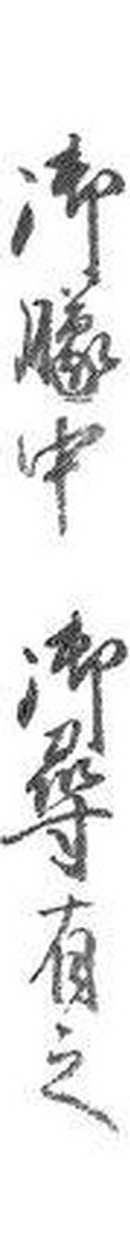御朦中御尋有之
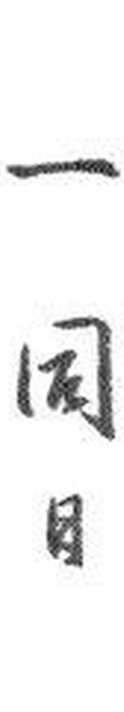一同日
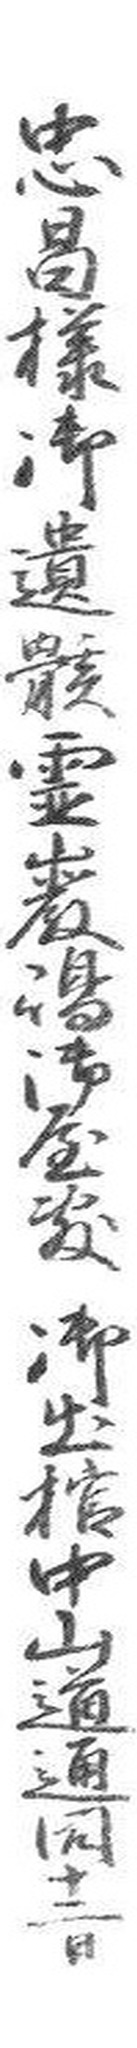忠昌様御遺骸霊厳島御屋敷御出棺中山道通同十二日
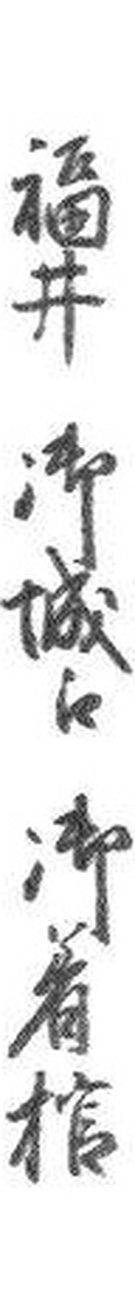福井御城江御着棺
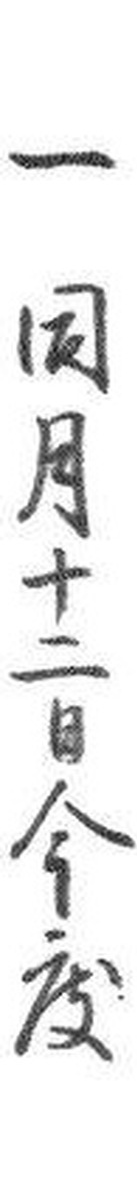一同月十二日今度
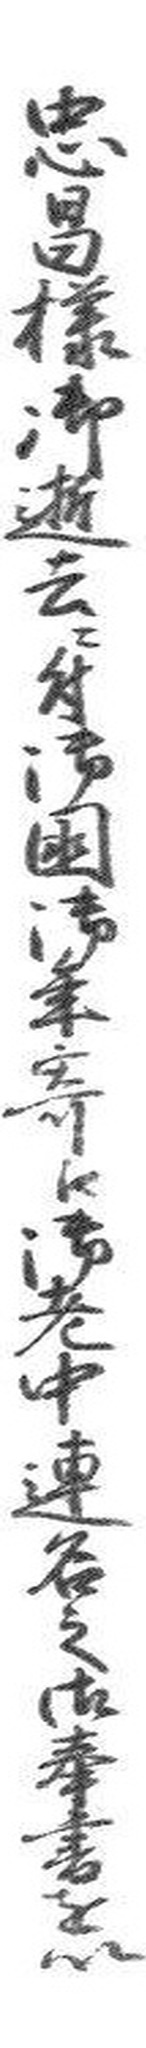忠昌様御逝去ニ付御国御年寄江御老中連名之御奉書を以
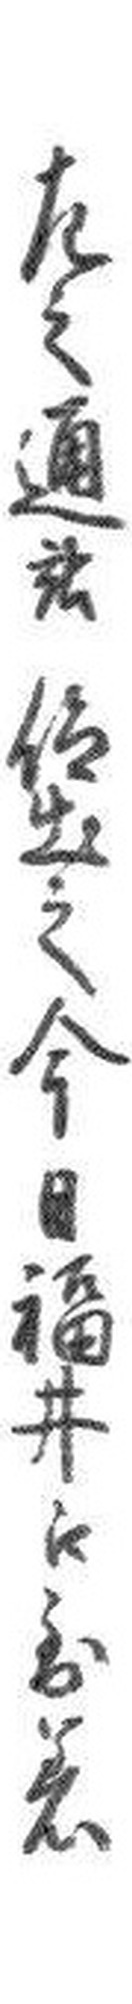左之通被仰出之今日福井江到着
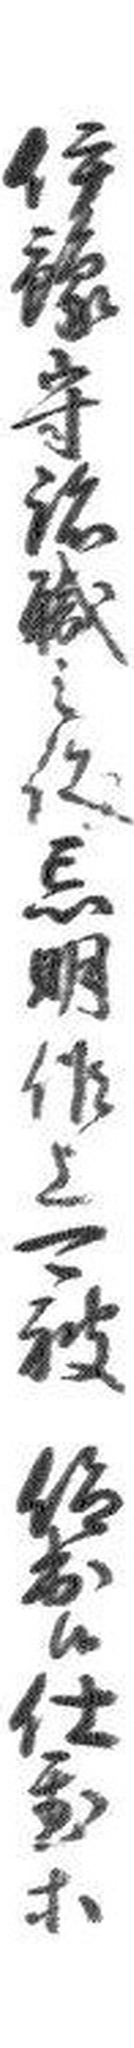伊予守跡職之儀忌明候上可被仰出候仕置等
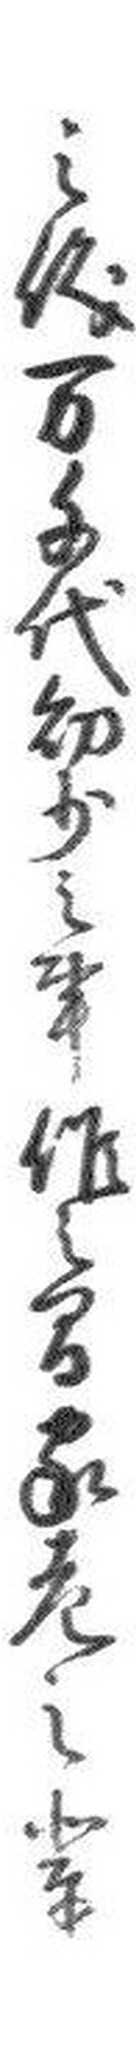之儀万千代幼少之事候之間家老之輩
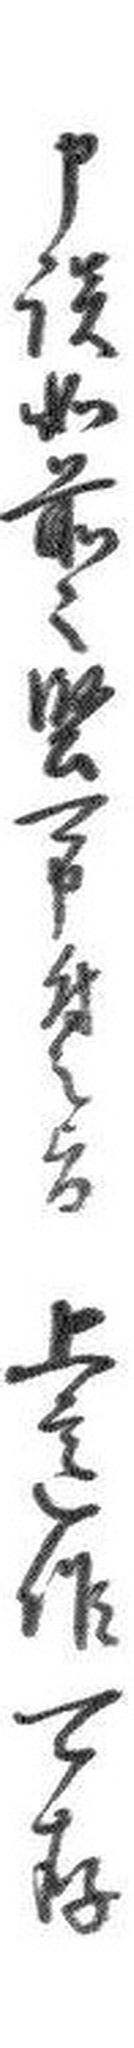申談如前々堅可申付之旨上意候可存
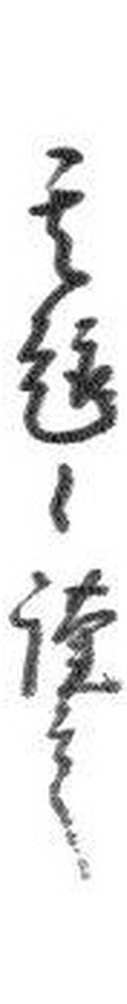其趣候謹言
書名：家譜 五 光通公 従寛永十三年到万治二年
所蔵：福井県文書館 Fukui Prefectural Archives
